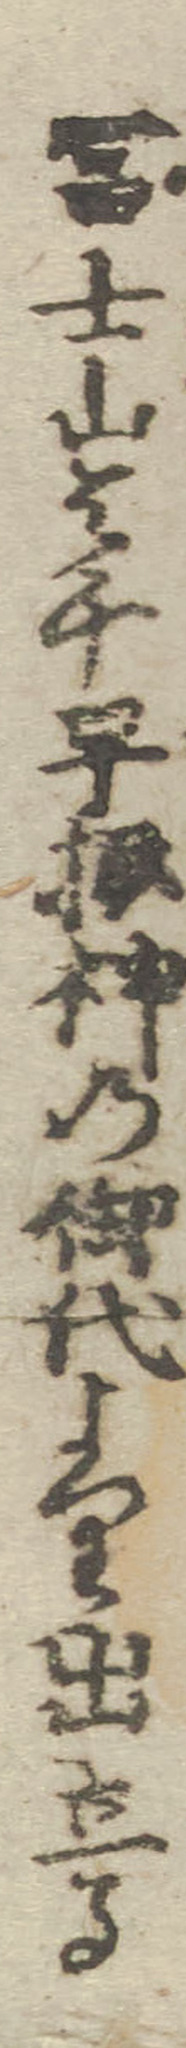冨士山は千早振神の御代より出立る
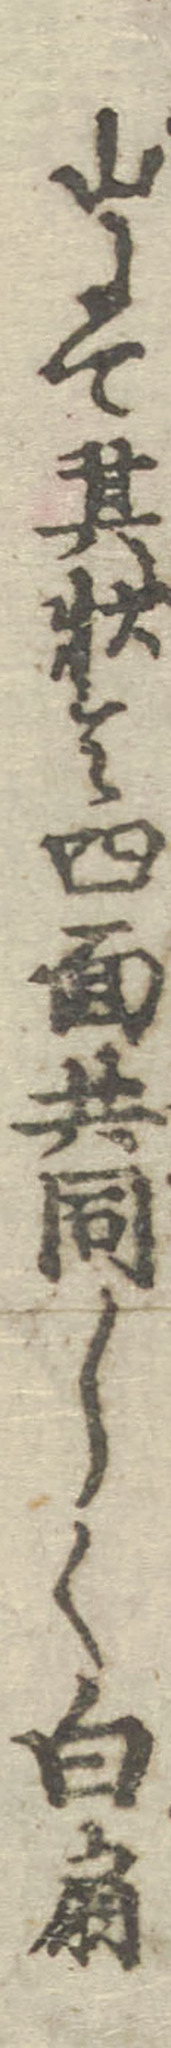山にて其状は四面共同しく白扇
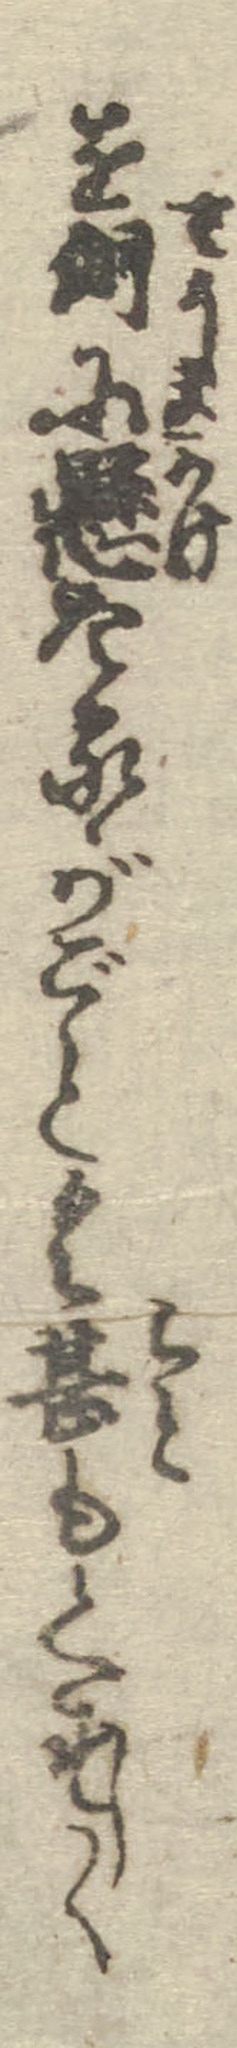を倒に懸たるがごとく甚もくすしく
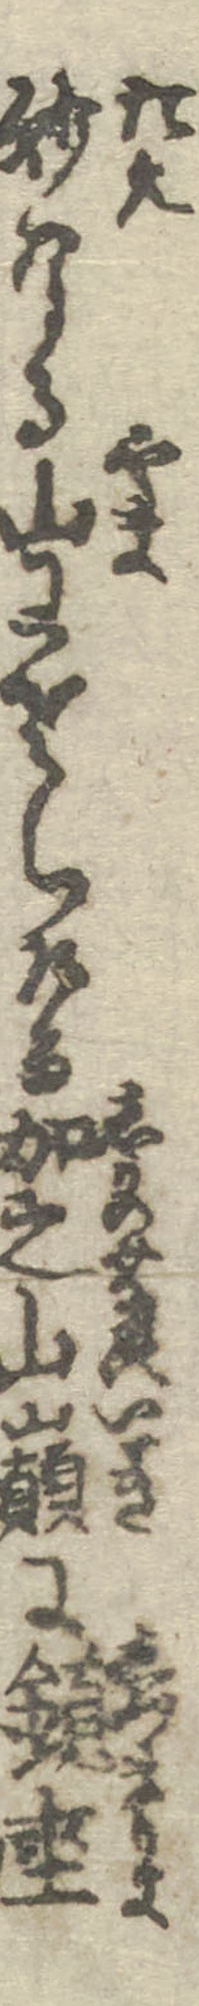妙なる山にける加之山巓に鎮座
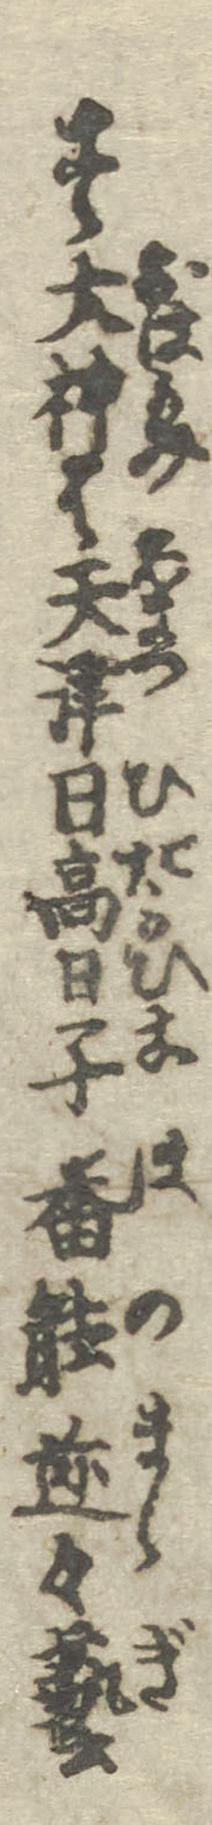す大神は天津日高日子番能迩々芸
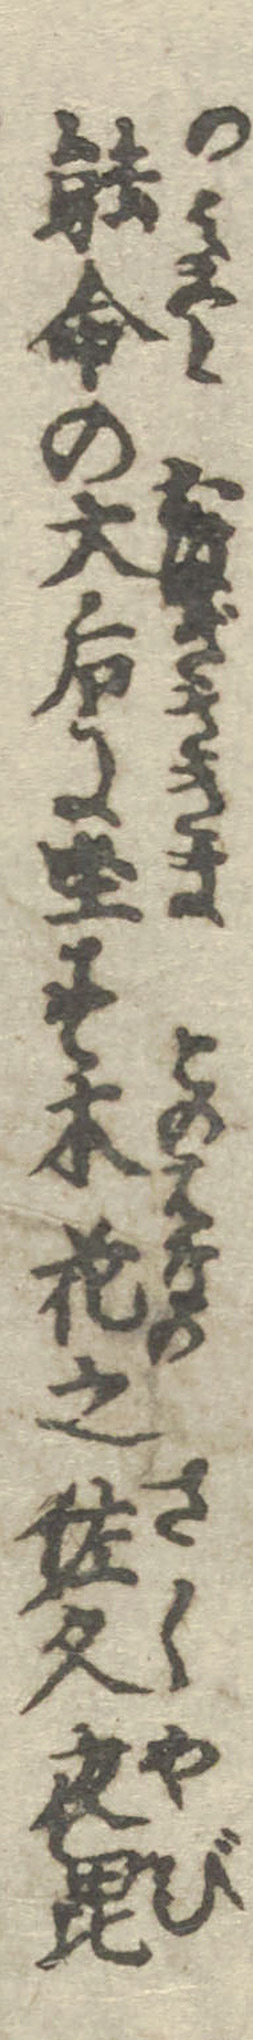命の大后に坐す木花之佐久夜毘
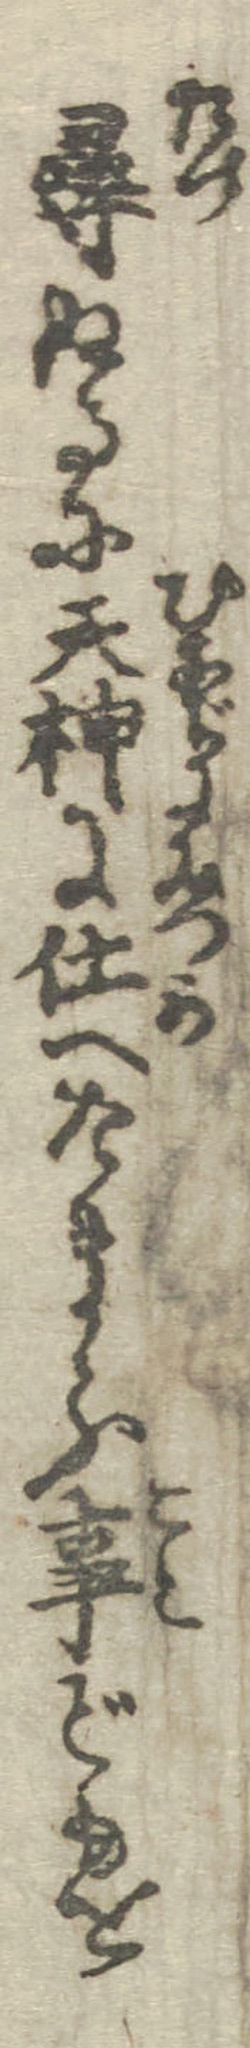尋ぬるに天神に仕へたまふ事どもを
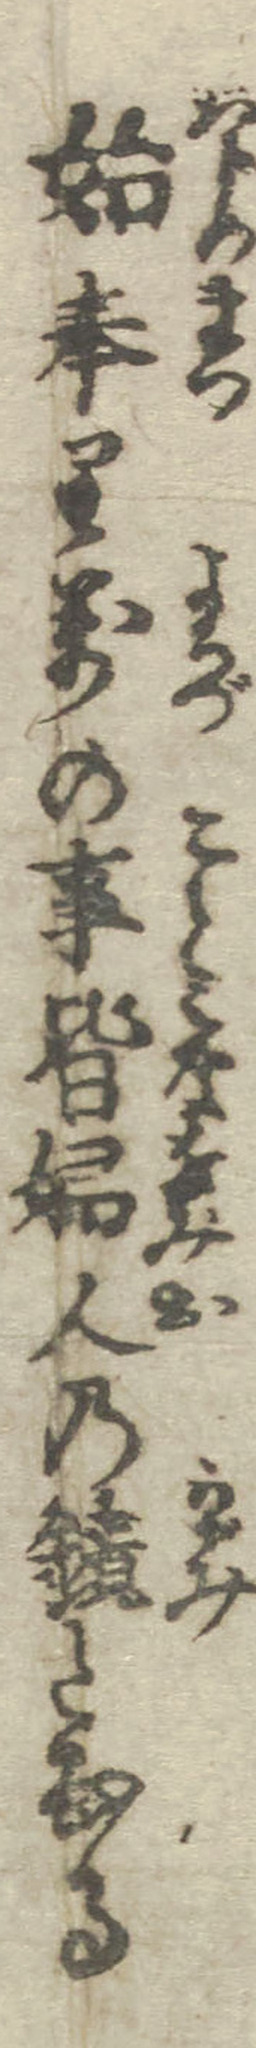始奉る万の事皆婦人の鏡となる
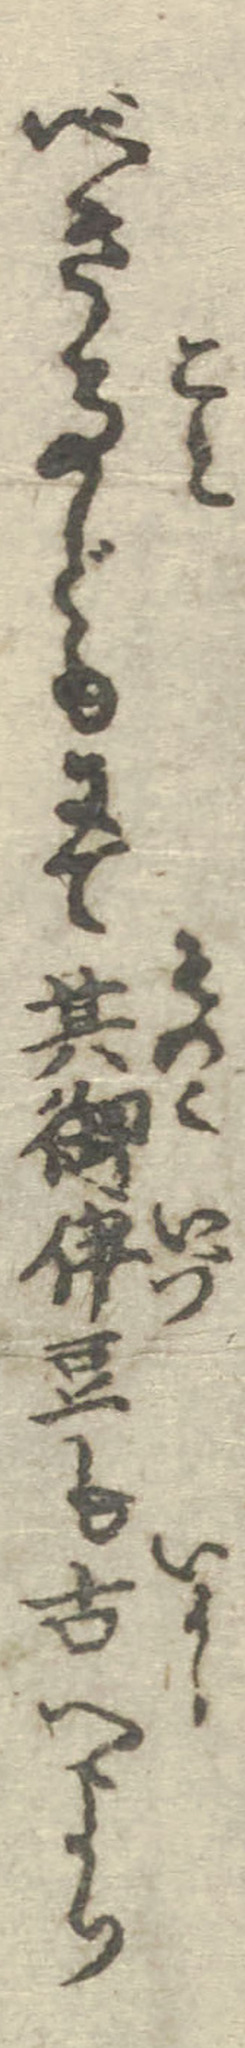へき事どもにて其御伊豆も古へより
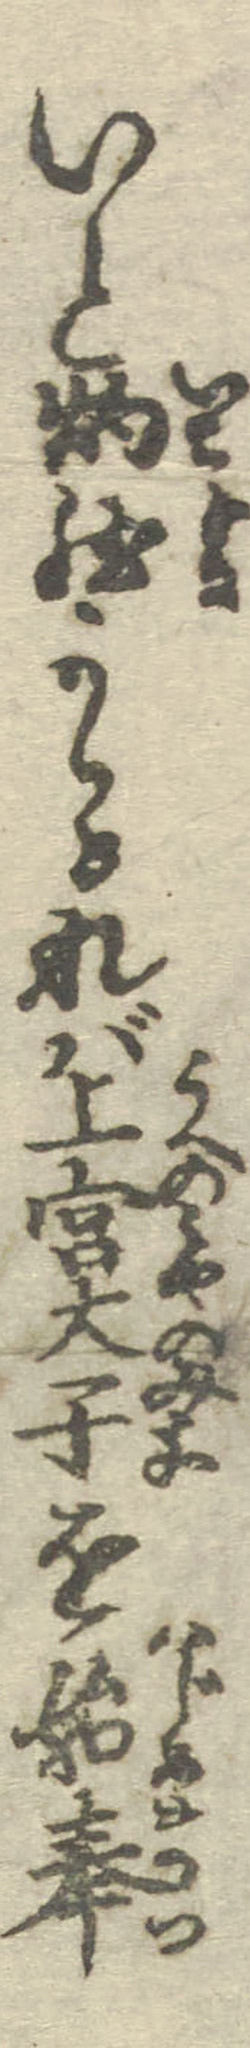いと然かるれバ上宮大子を始奉
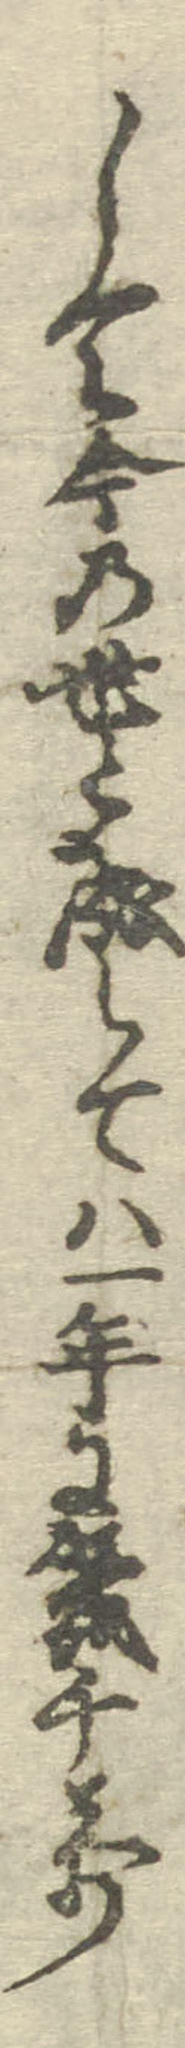して今の世と成てハ一年に幾千万
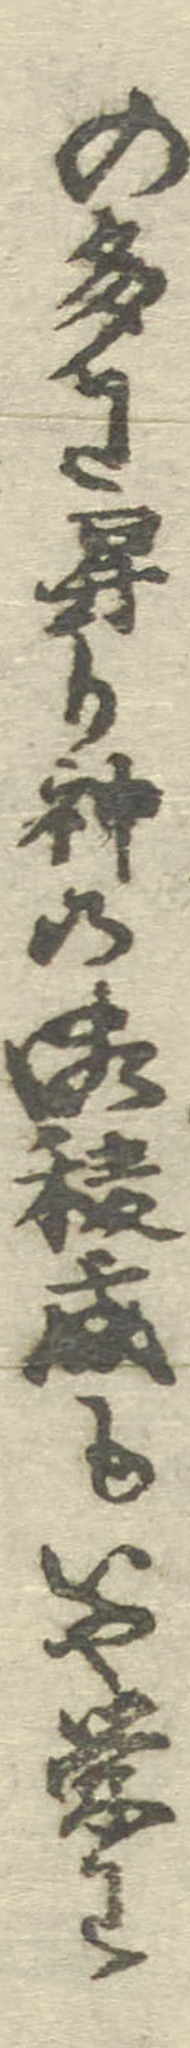の多に昇り神御稜威もいや栄に
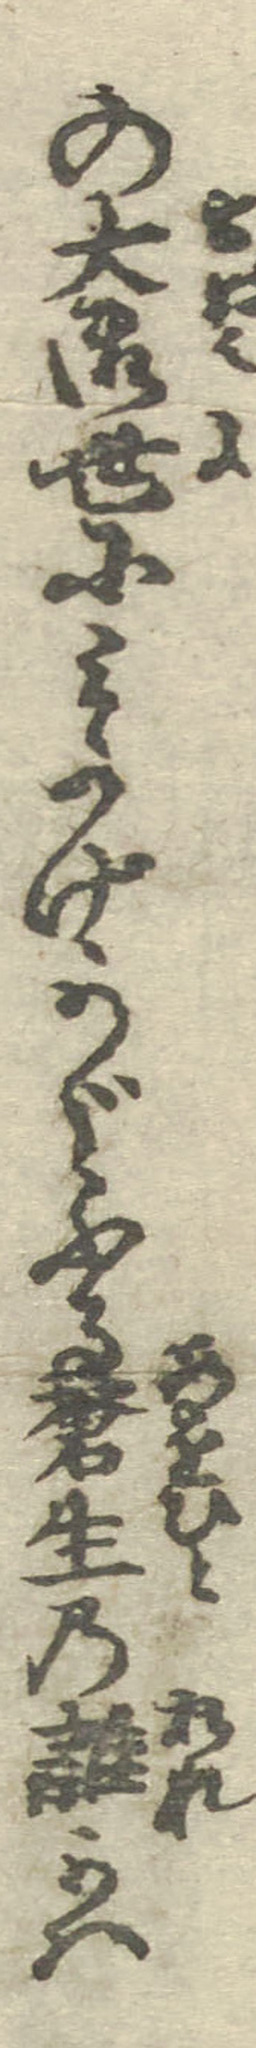の大御世にそのみかげかゞふる蒼生の誰かハ
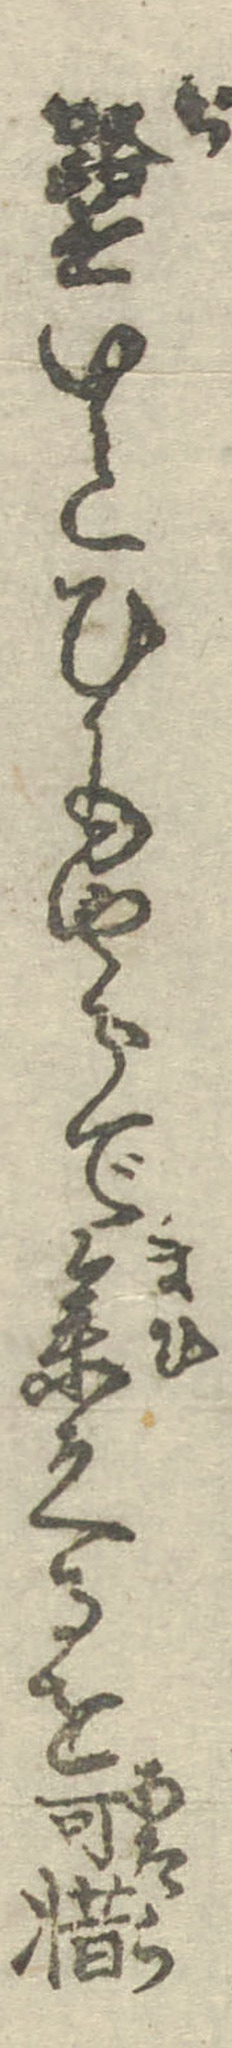路をいとひもやらで来くるを可惜
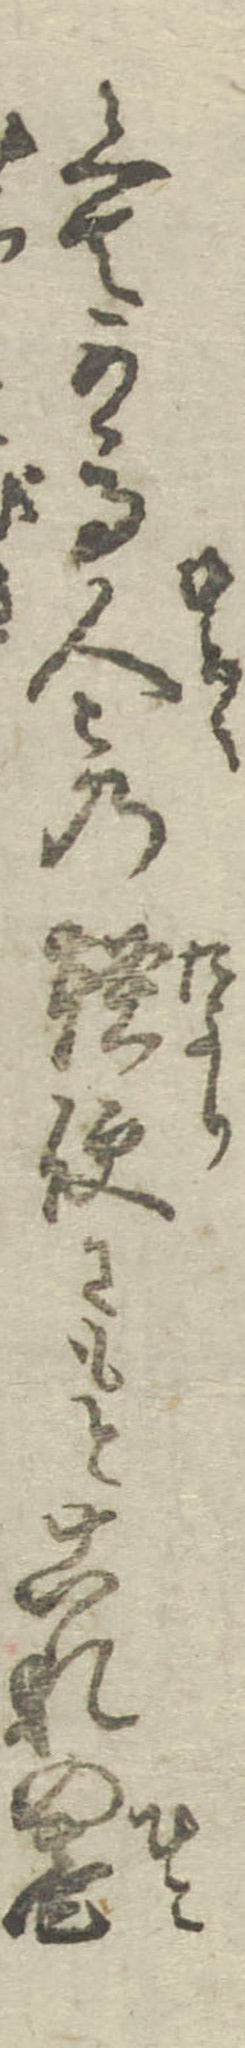くてかゝる人々の便にもとなれの壱
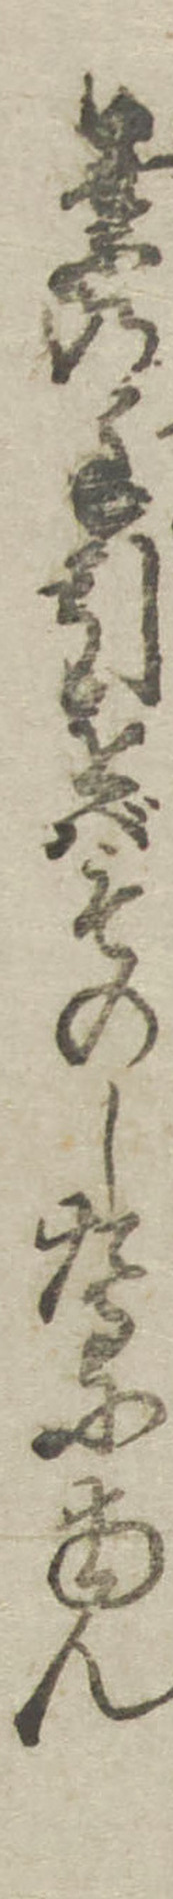葉の手引をバものしたるになん
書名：駿河国富士山表口全図 直立一千四百十七丈
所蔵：東京大学総合図書館 General Library in the University of Tokyo, JAPAN
